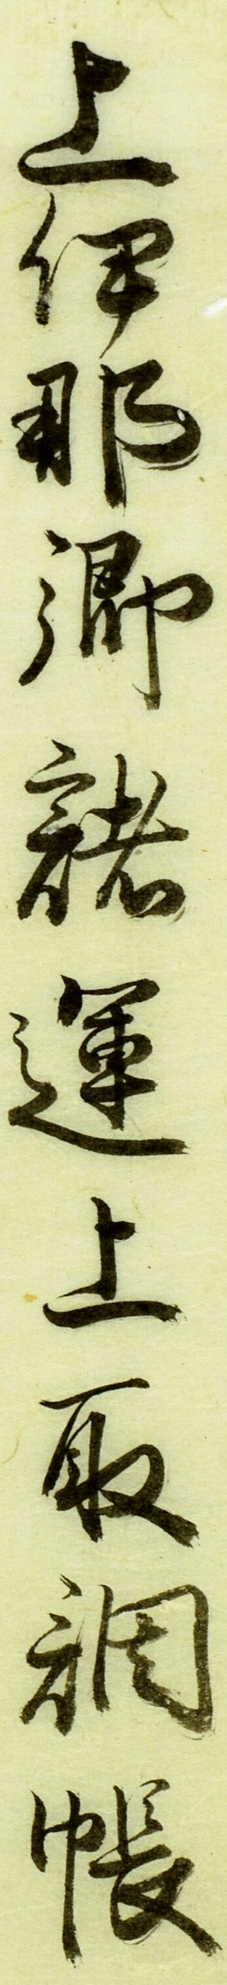上伊那郷諸運上取帳調
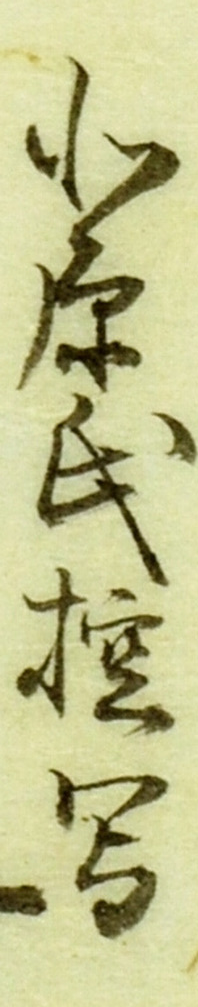北原氏控写

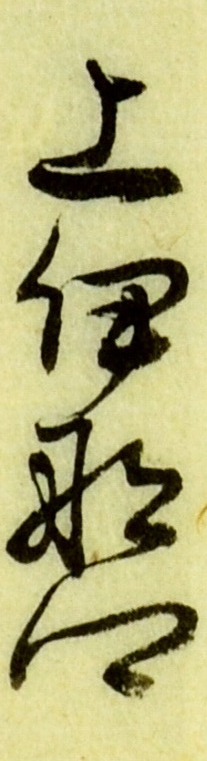上伊那郷
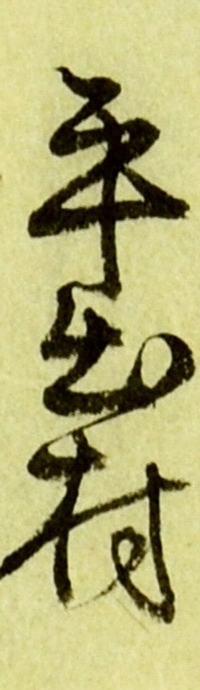平出村
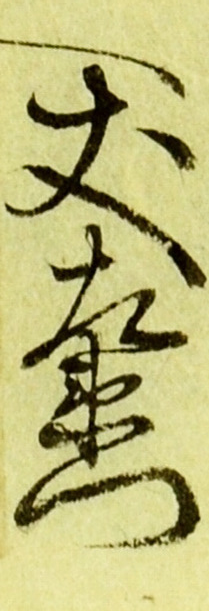丈左衛門
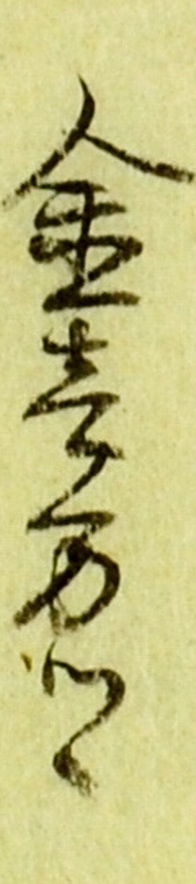金壱分ツゝ
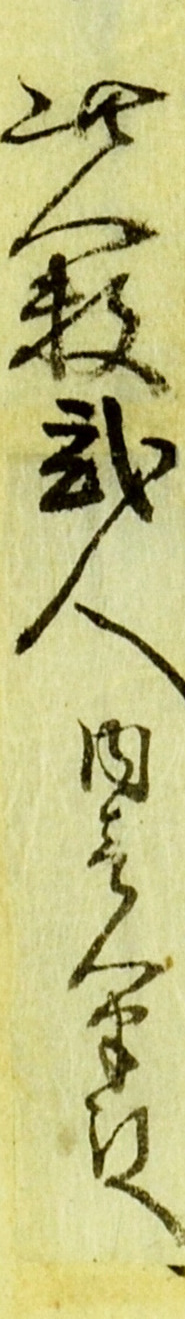此人数弐人内壱人半役
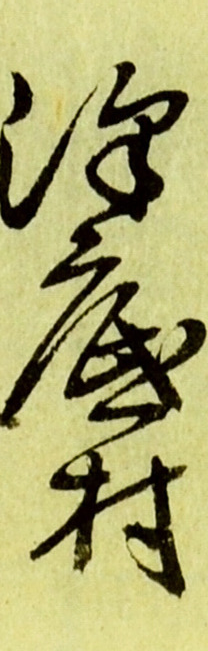沢底村
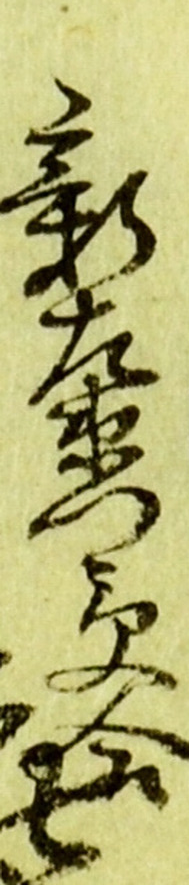新左衛門受合
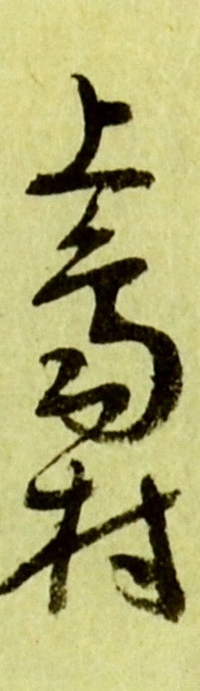上島村
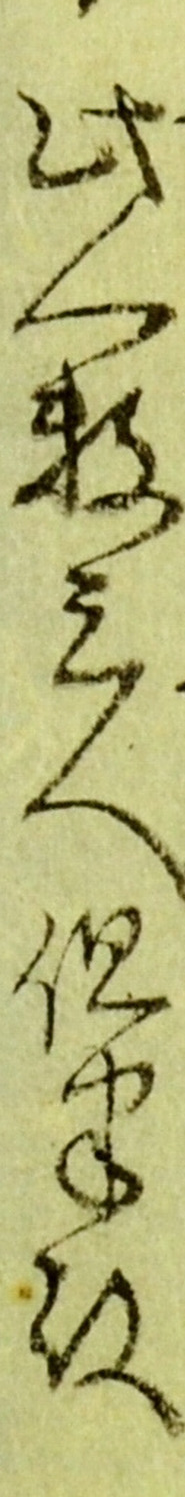此人数三人但半役

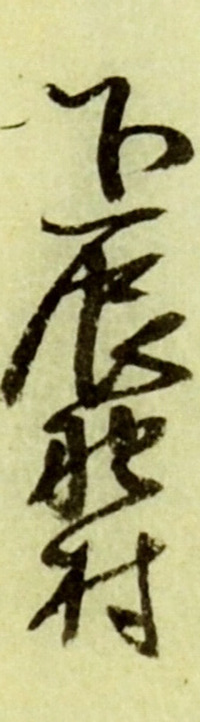下辰野村
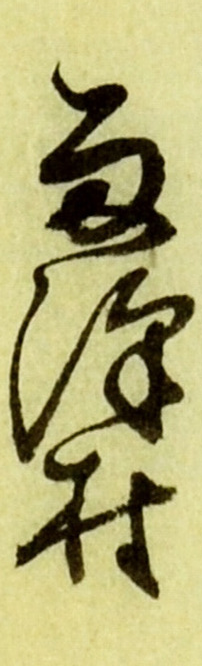雨沢村
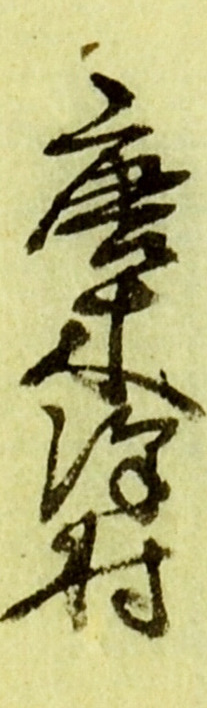唐木沢村
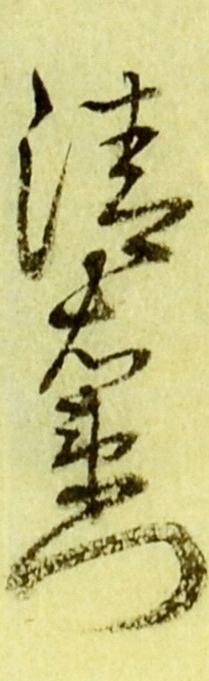治右衛門
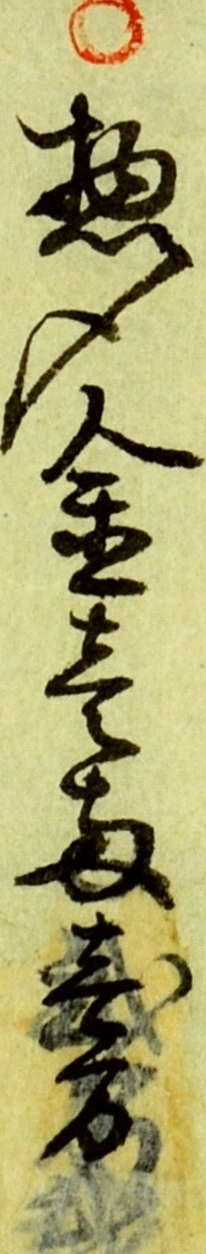〇惣〆金壱両壱分
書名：上伊那郷諸運上取調帳
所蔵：伊那市立高遠町図書館・合同会社AMANE
